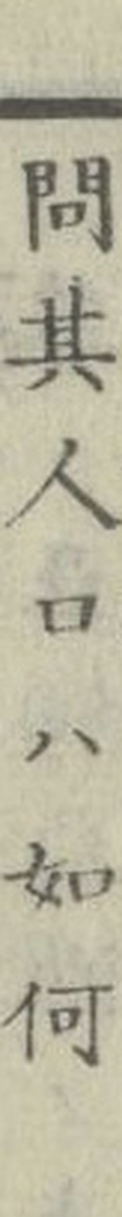問其人口ハ如何
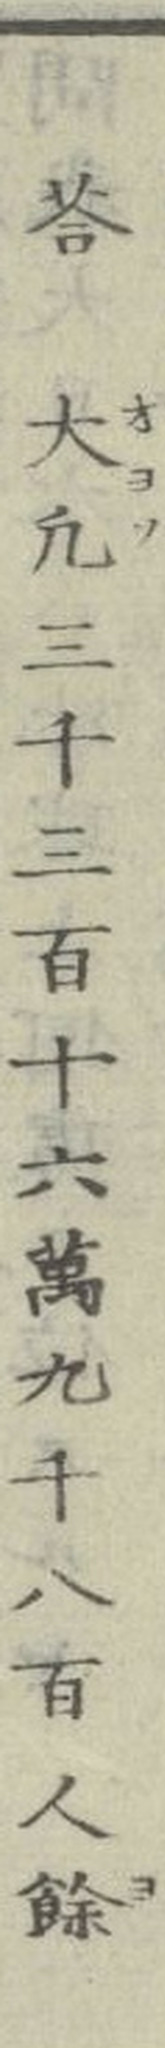答大凢三千三百十六萬九千八百人餘
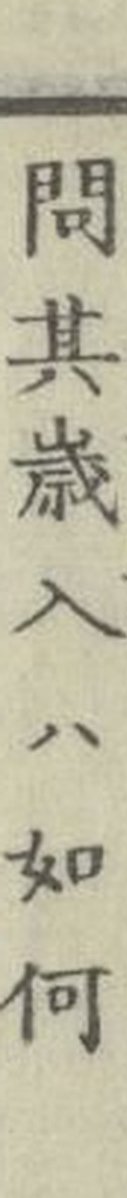問其歳入ハ如何
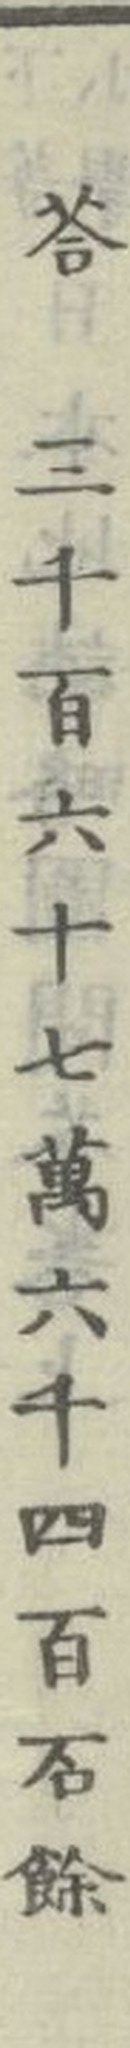答三千百六十七萬六千四百石餘
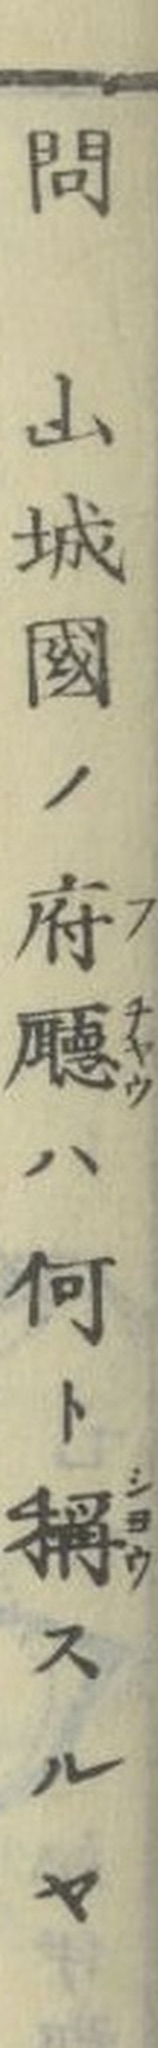問山城國ノ府廳ハ何ト稱スルヤ
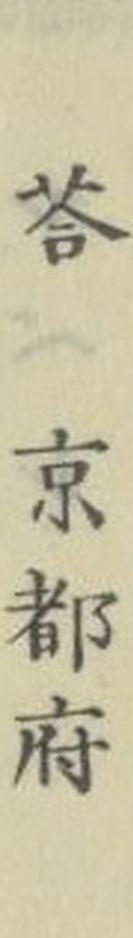答京都府
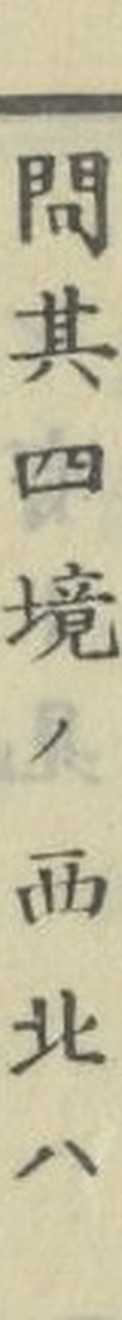問其四境ノ西北ハ
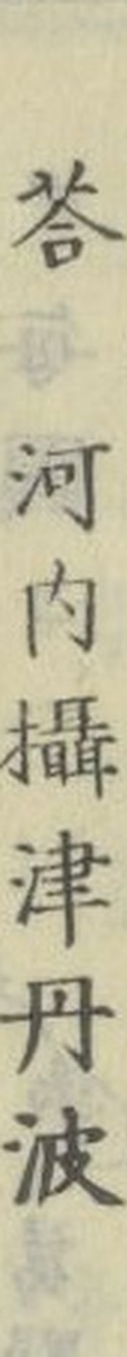答河内攝津丹波
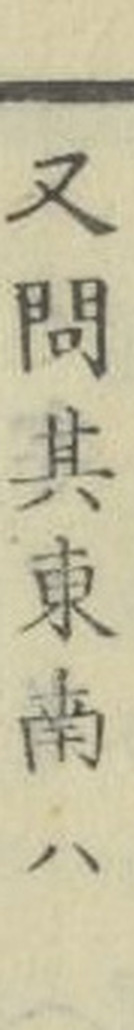又問其東南ハ
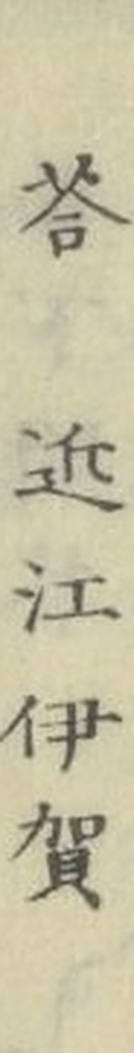答近江伊賀
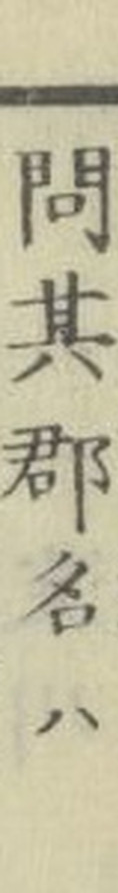問其郡名ハ
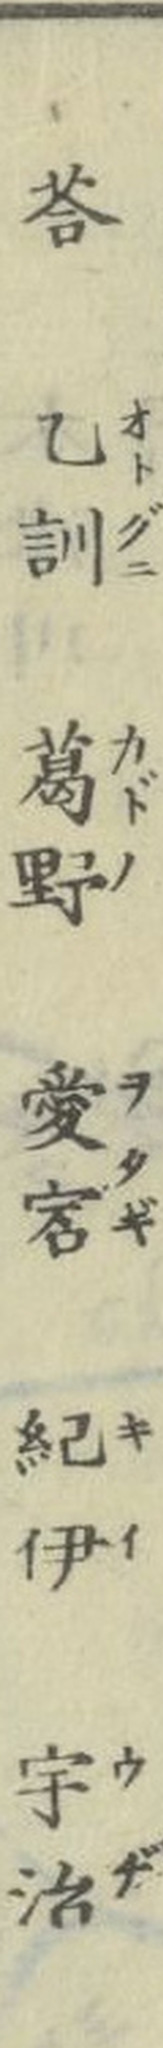答乙訓葛野愛宕紀伊宇治
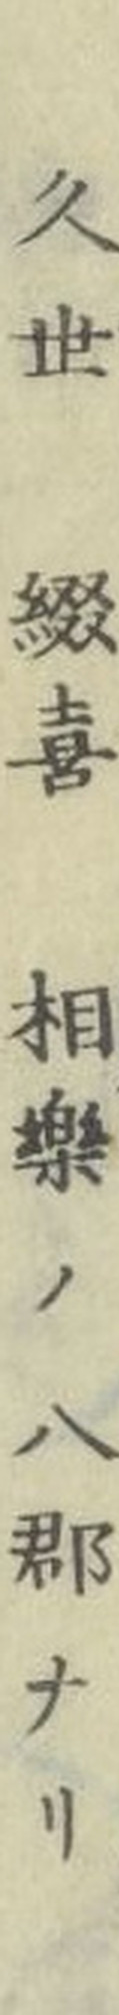久世綴喜相樂ノ八郡ナリ
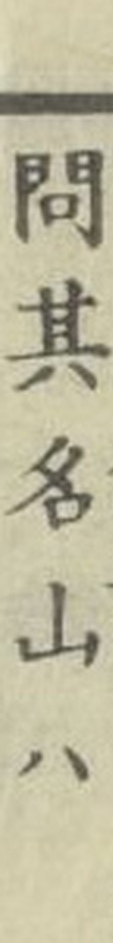問其名山ハ
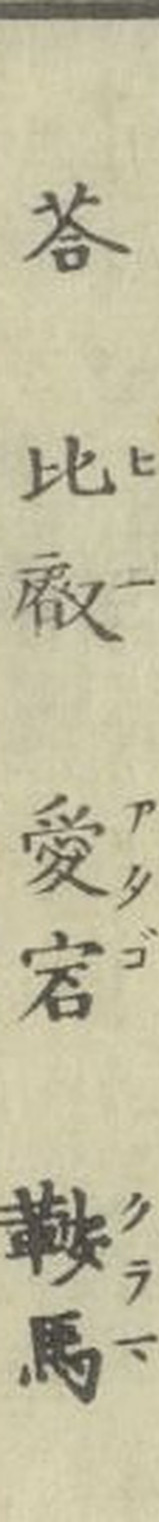答比叡愛宕鞍馬

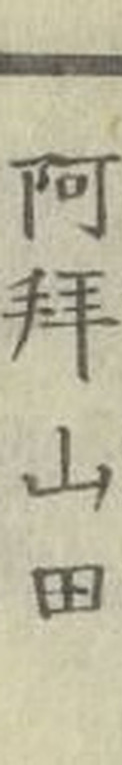阿拜山田
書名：下等小学日本地誌略図問答 巻上 畿内東海道之部
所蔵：University of the Ryukyus Library
